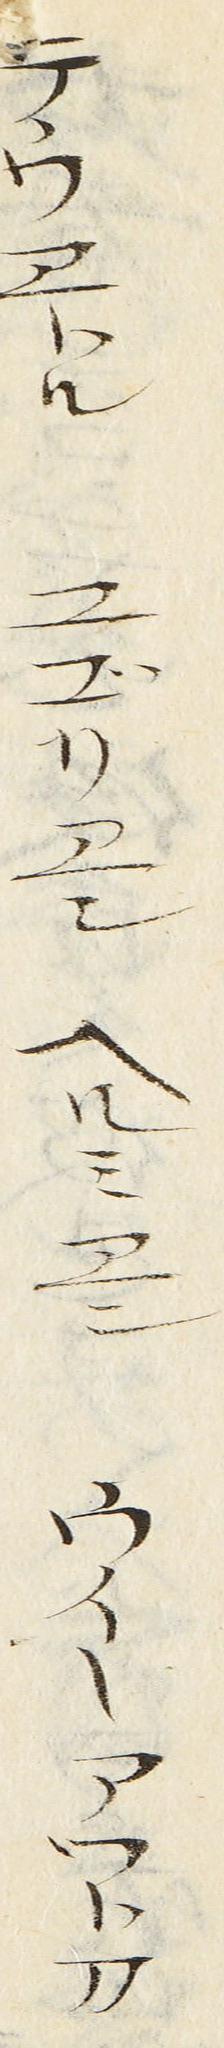テウヱトルユゴリヱンヘルミヱンウイーアツトカ
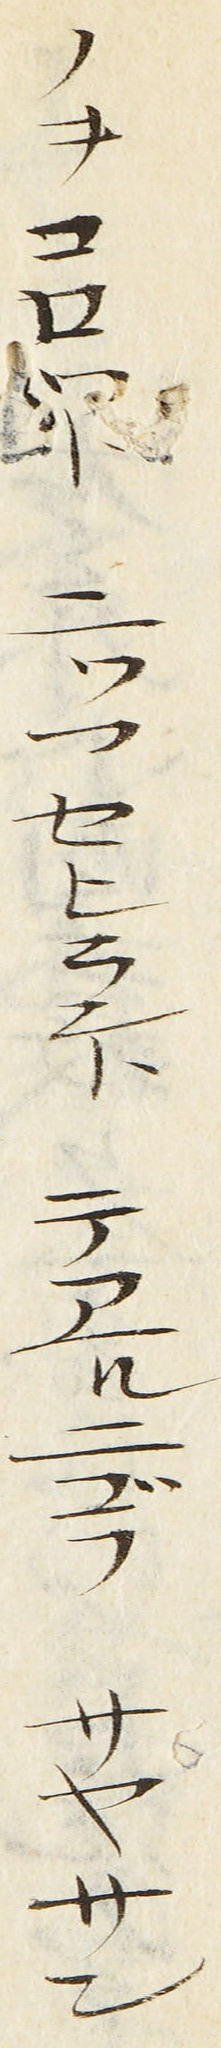ノヲコロツトニツフセヒラントテヱルニゴフサヤサン
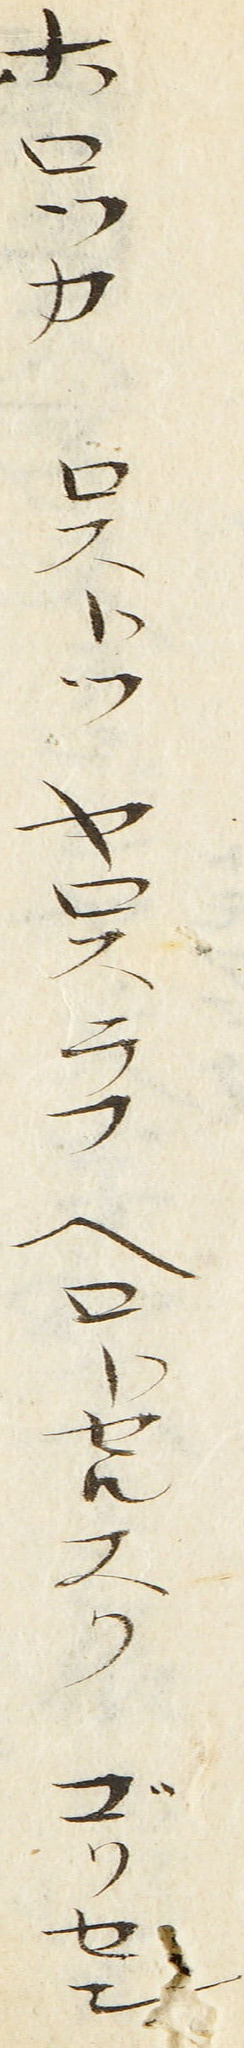ホロツカトストフヤロスラフヘロトセルスクゴリセン
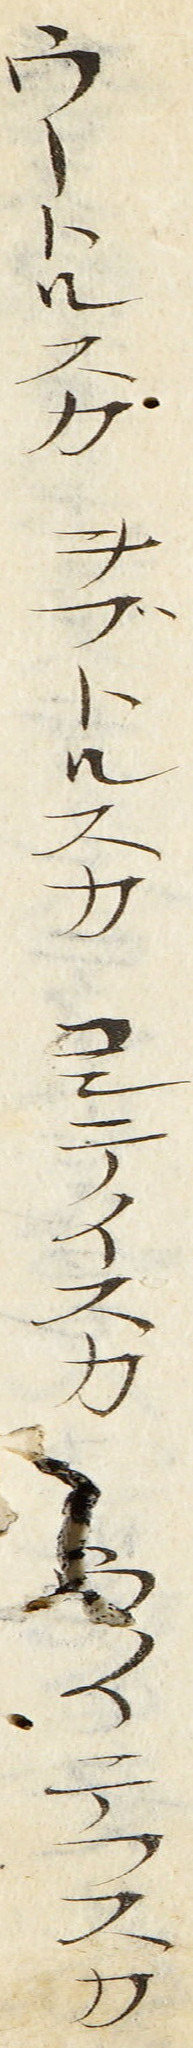ウートルスカヲブトルスカコンテイスカウイテフスカ
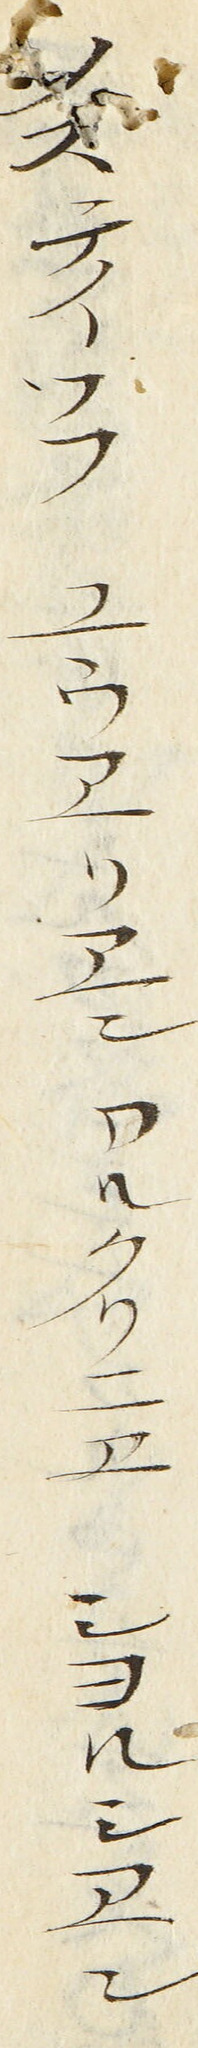メステイツフユウヱリヱンカルクリニヱシヨルシヱン

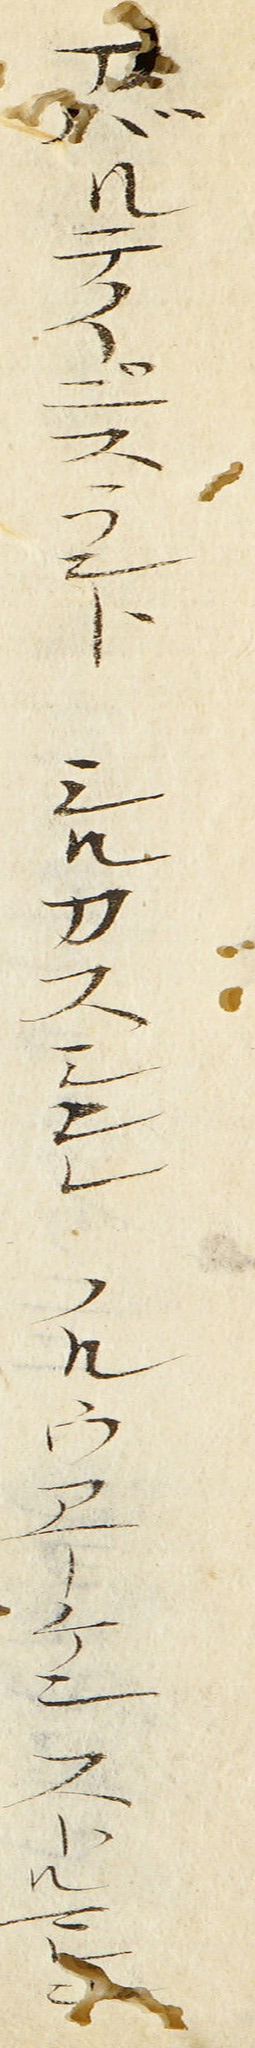カバルテイ。ニスラントシルカスシシンノルウヱーケンストルテレン
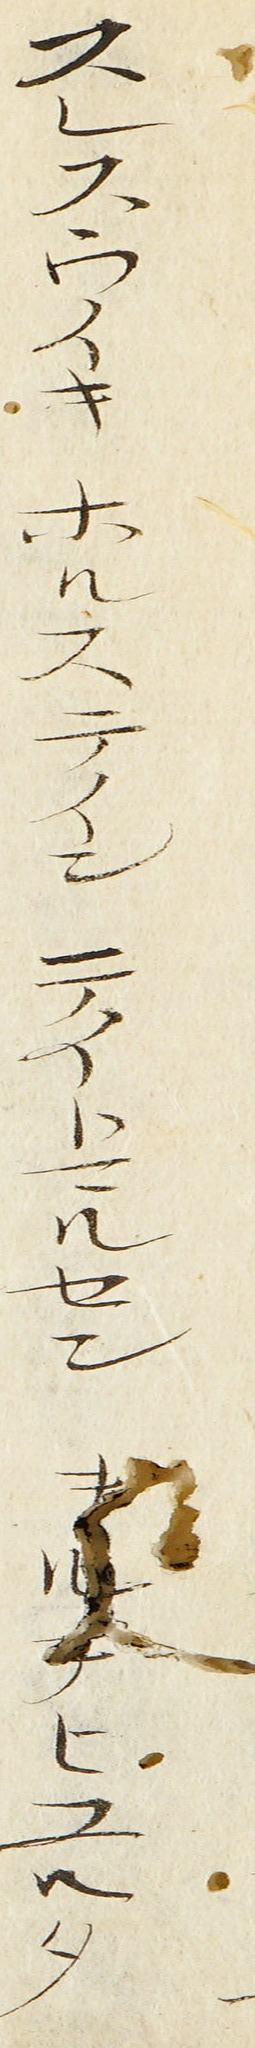スレスウイキホルステインテイトマルセンヲルテヒユルタ
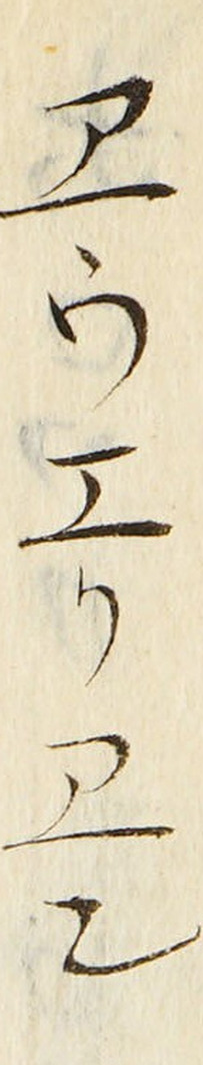ヱウエリヱン
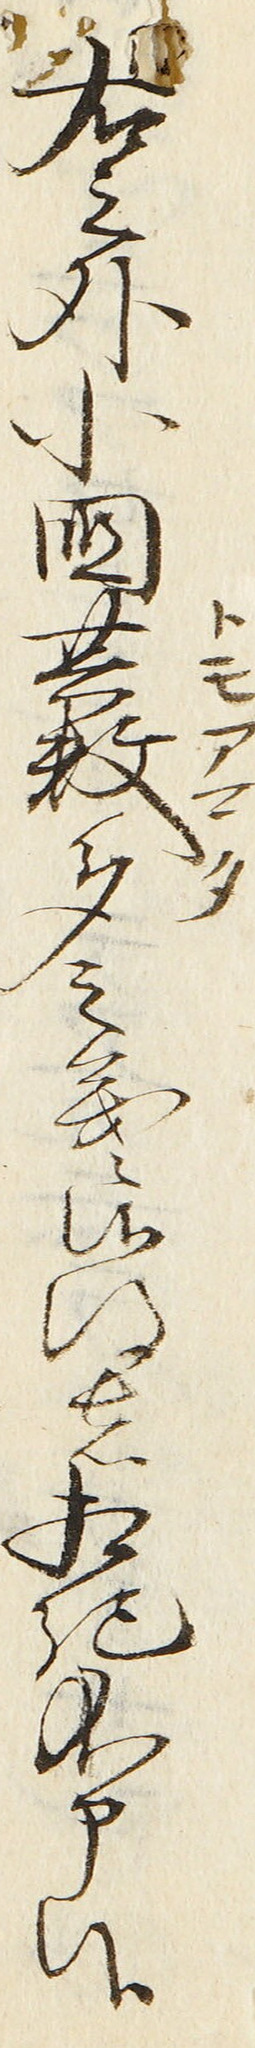右之外小国共数多之義に候得は相記不申候
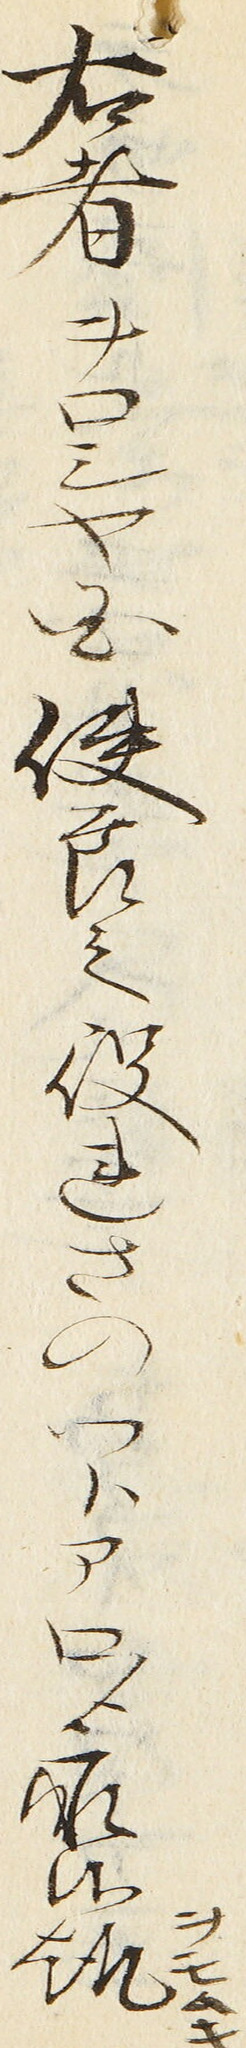右者ヲロシヤ国使節之役れさのつと申口より承候趣
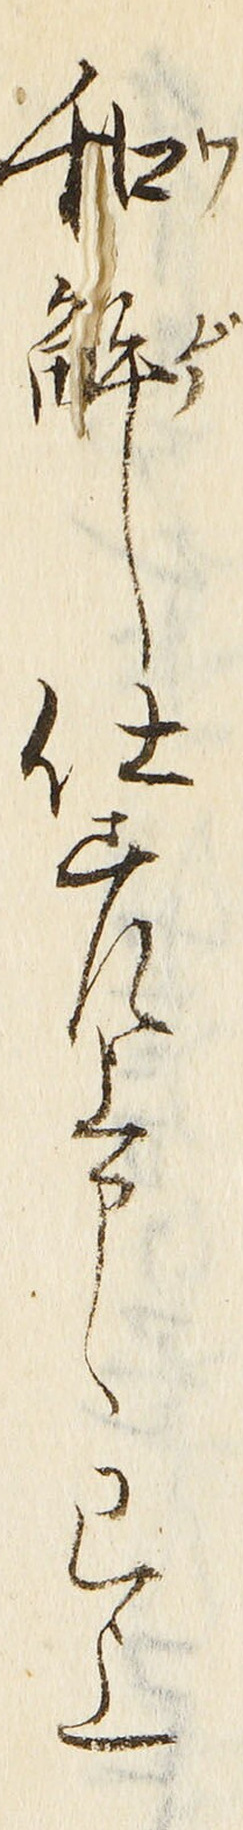和解し仕差上申候已上
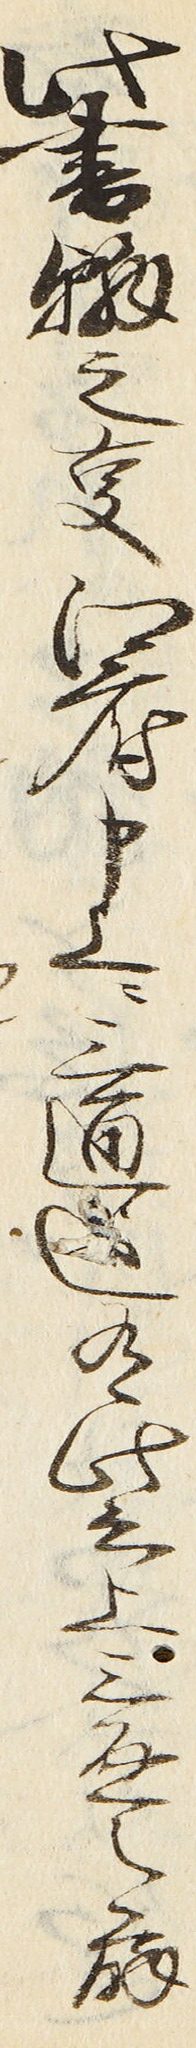此書翰之事江府申上に三通迄有此言上三通の扇
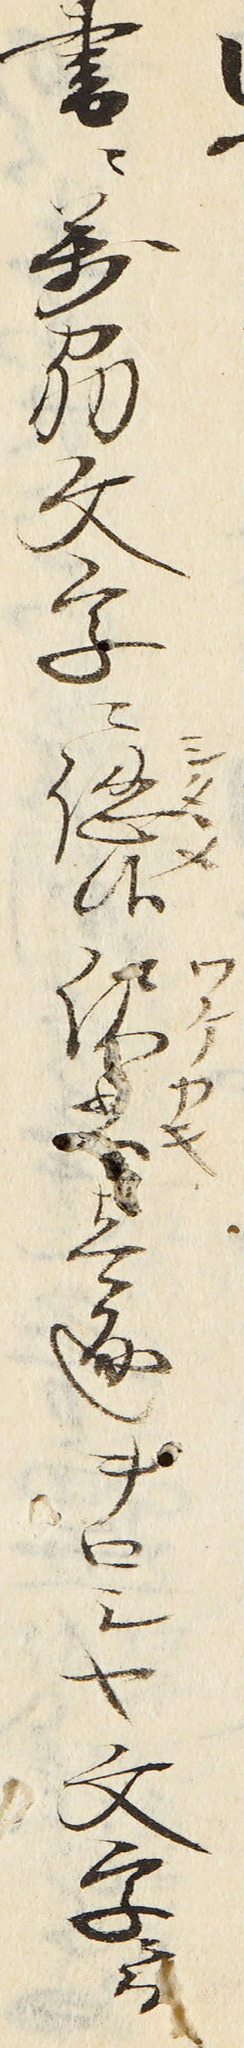書に万州文字に認候訳書壱通ヲロシヤ文字にて
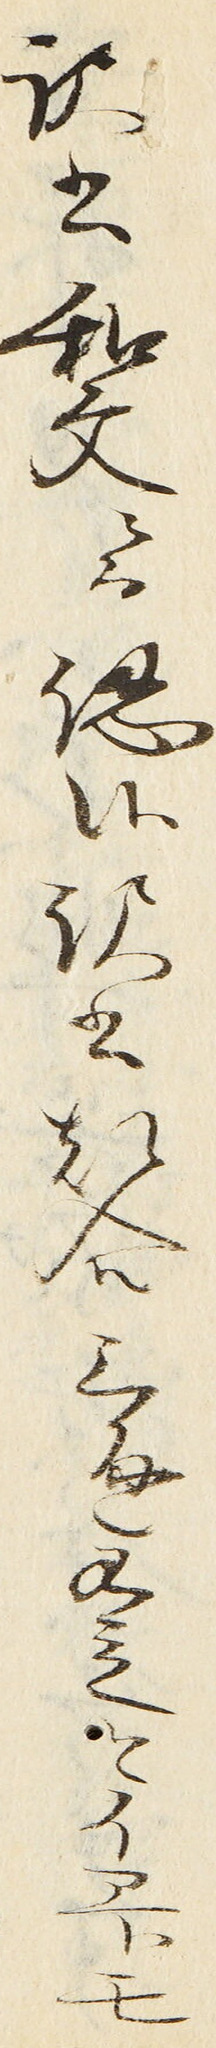訳書和文にて認候訳書都合三通有之とイヱトモ
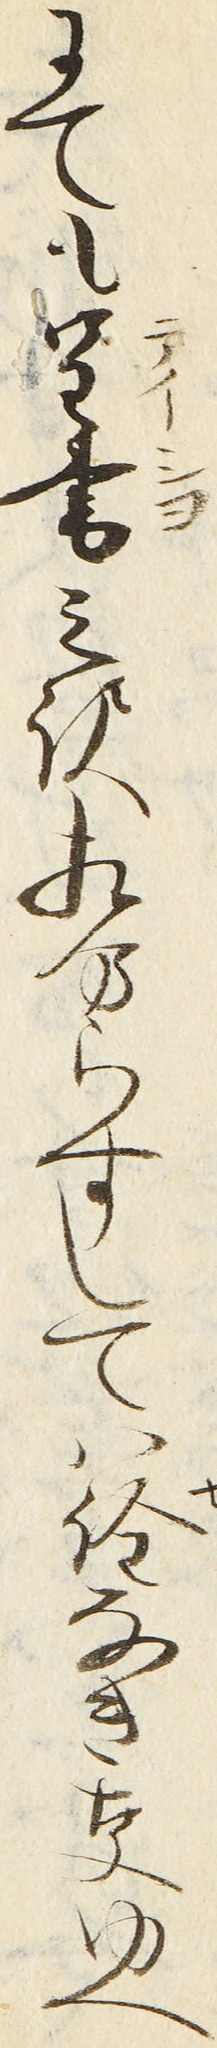にても呈書之訳相分らすしては詮なき事ゆへ
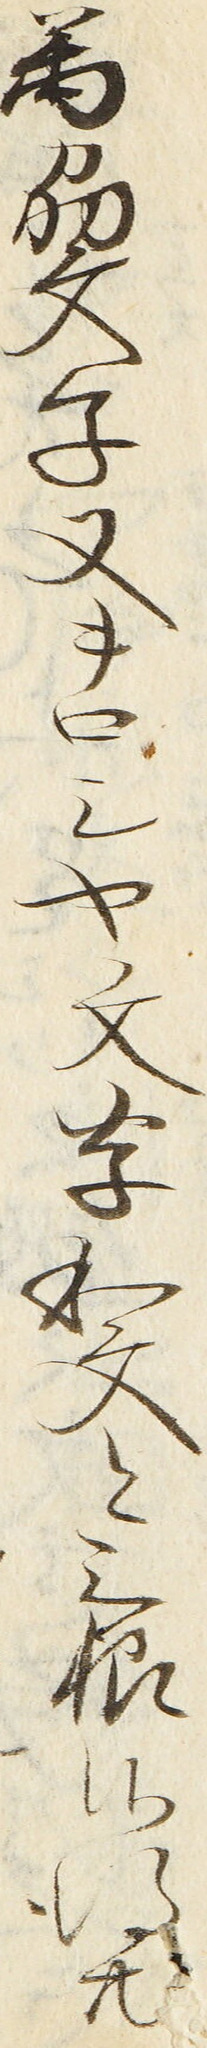万州文字又ヲロシヤ文字和文と三様候得共
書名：魯西亜国舟渡来始末并日本流漂人異国遍歴之話（西洋欧羅巴州之内一）
